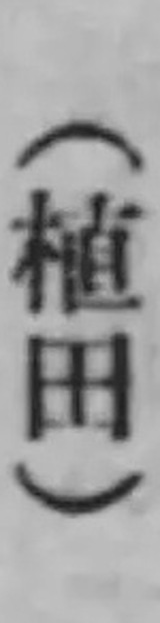(植田)
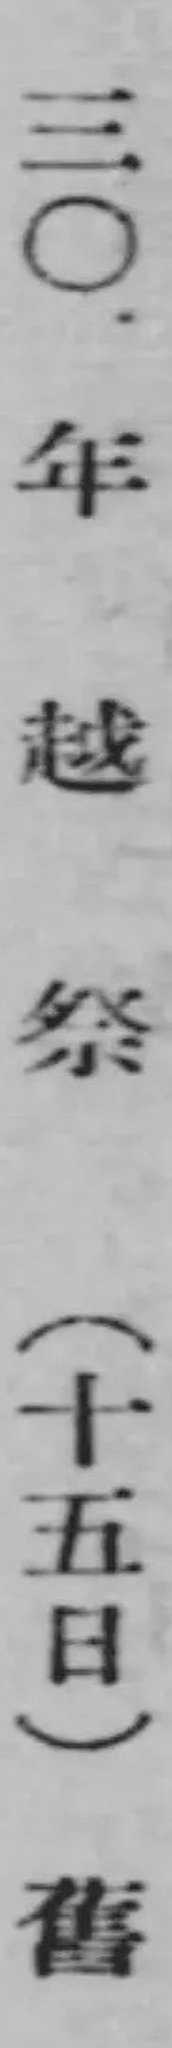三〇年越祭(十五日)舊
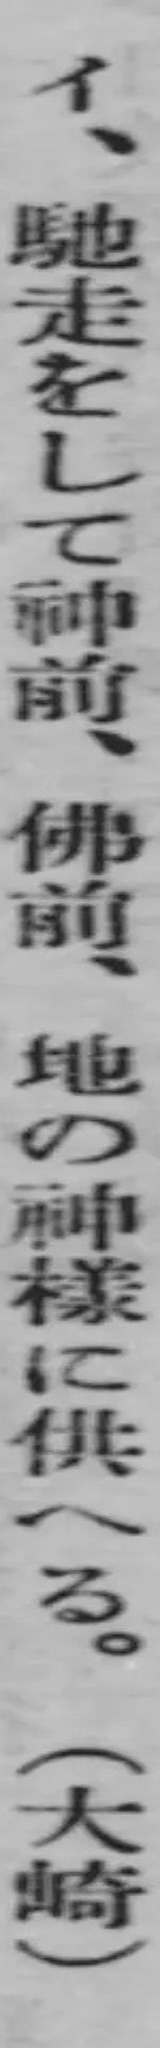イ、馳走をして神前、佛前、地の神様に供へる。(大崎)
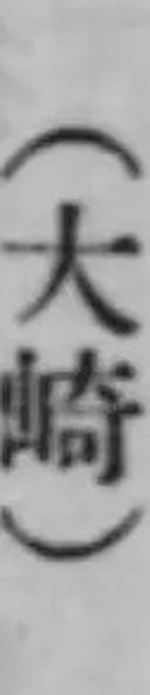(大崎)
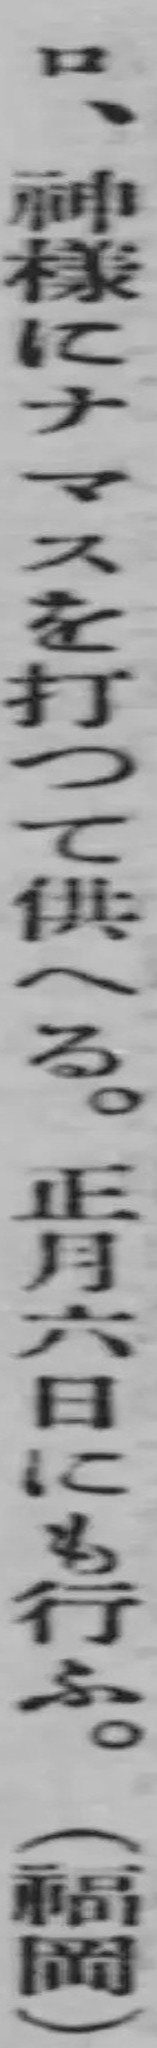ロ、神様にナマスを打つて供へる。正月六日にも行ふ。(福岡)
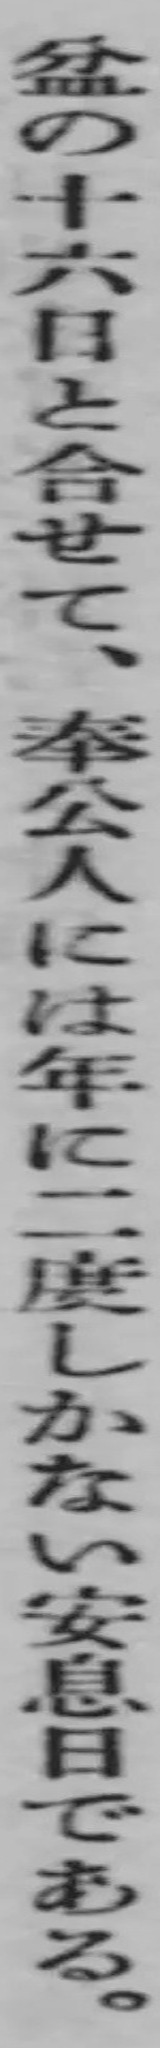盆の十六日と合せて、奉公人には年に二度しかない安息日である。

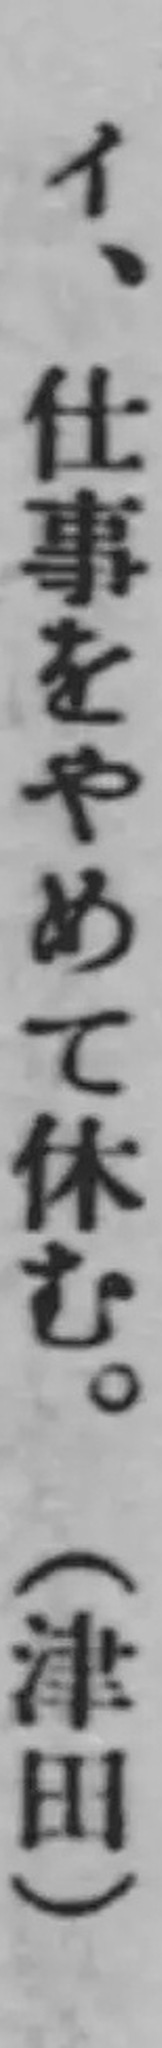イ、仕事をやめて休む。(津田)
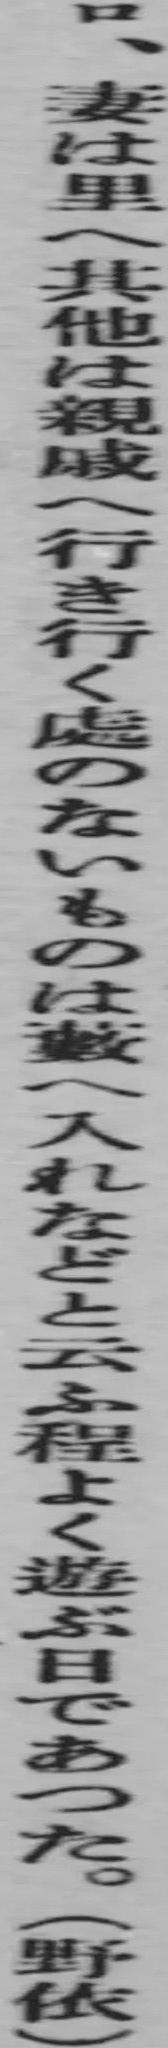ロ、妻は里へ其他は親戚へ行き行く處のないものは藪へ入れなどと云ふ程よく遊ぶ日であつた。(野依)
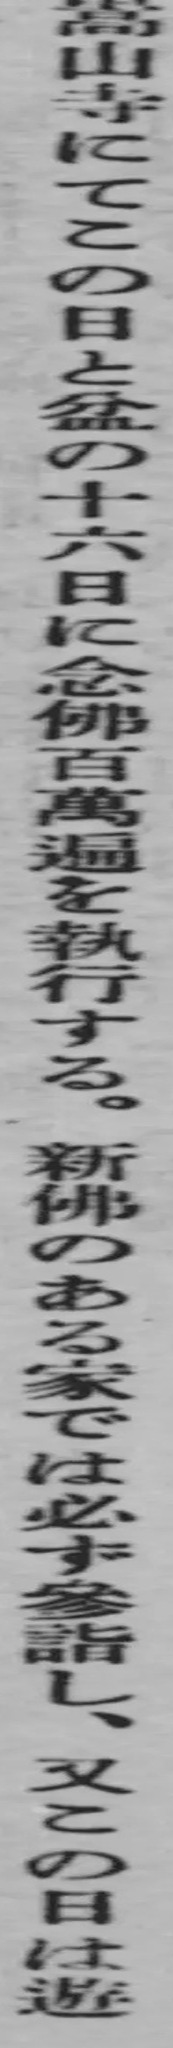嵩山寺にてこの日と盆の十六日に念佛百萬遍を執行する。新佛のある家では必ず參詣し、又この日は遊
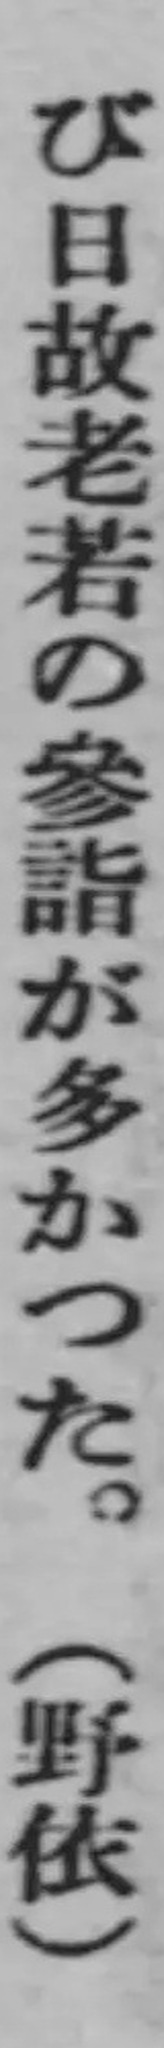び日故老若の參詣が多かつた。(野依)
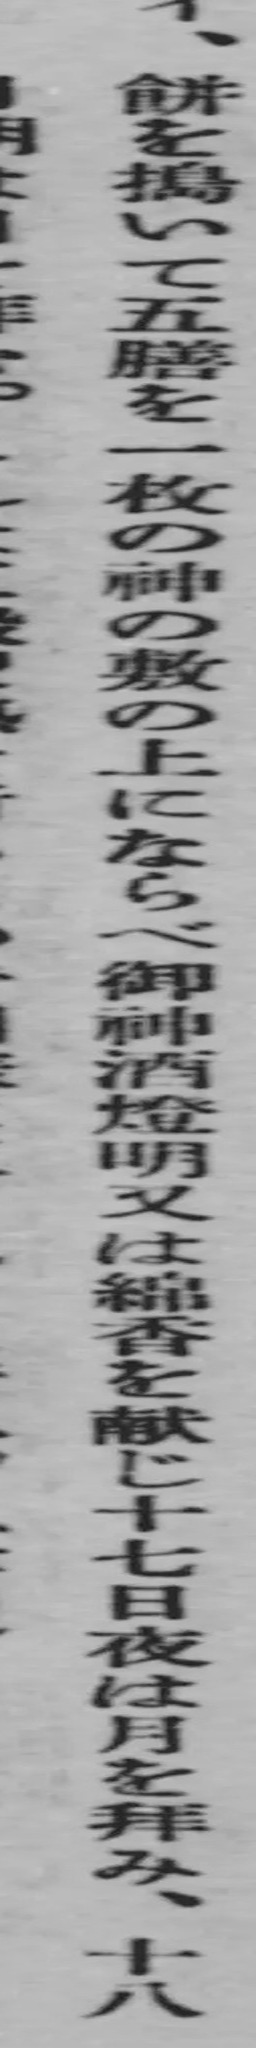イ、餅を搗いて五膳を一枚の神の敷の上にならべ御神酒燈明又は線香を献じ十七日夜は月を拜み、十八
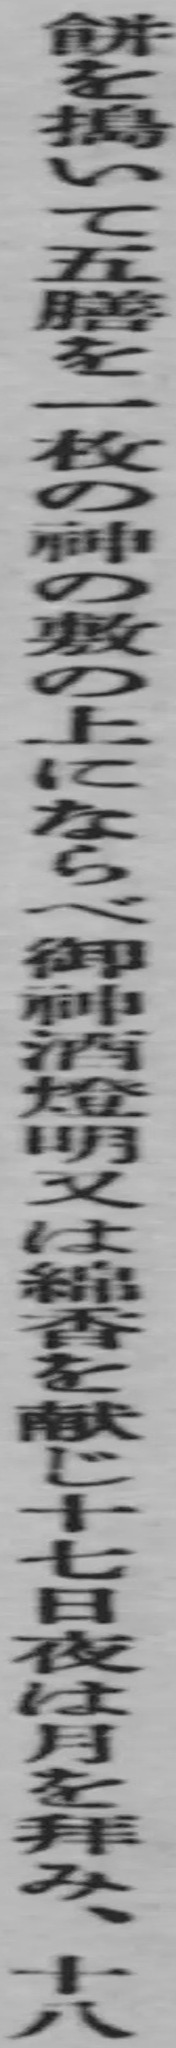イ、餅を搗いて五膳を一枚の神の敷の上にならべ御神酒燈明又は線香を献じ十七日夜は月を拜み、十八
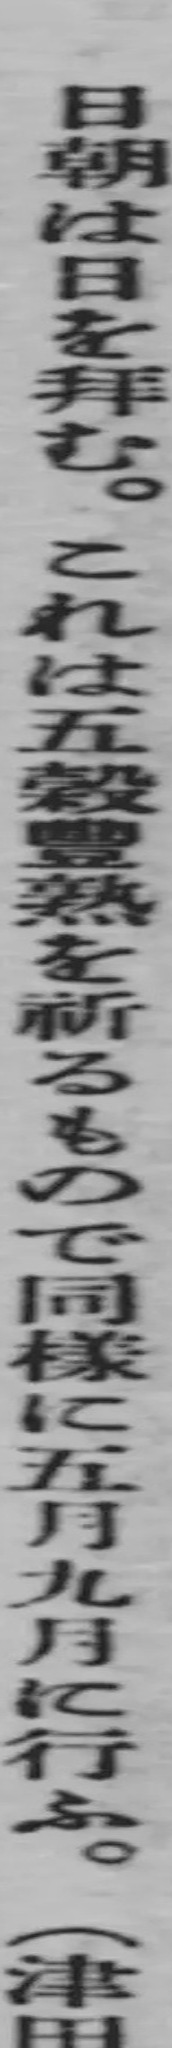日朝は日を拜む。これは五穀豊熟を祈るもので同様に五月九日に行ふ。(津田)
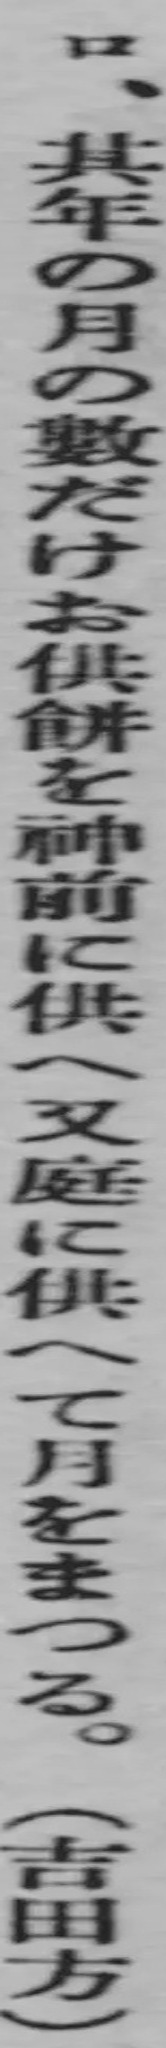ロ、其年の月の數だけお供餅を神前に供へ又庭に供へて月をまつる。(吉田方)
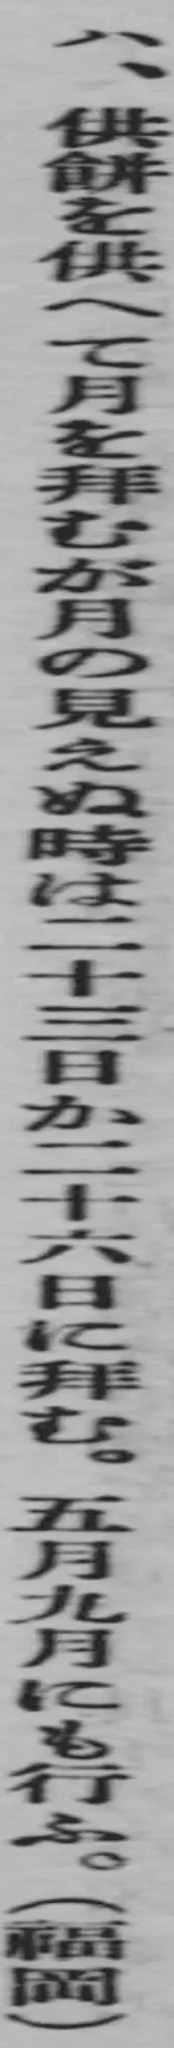ハ、供餅を供へて月を拜むが月の見えぬ時は二十三日か二十六日に拜む。五月九日にも行ふ。(福岡)
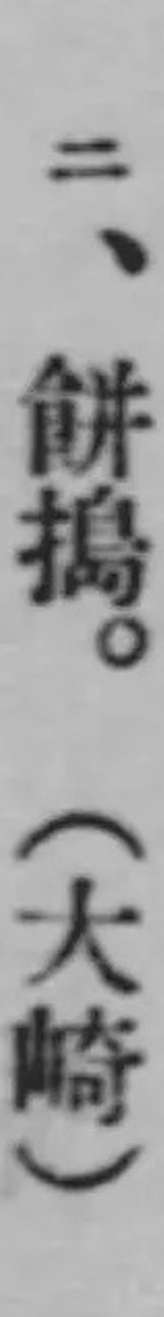ニ、餅搗。(大崎)
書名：豊橋の年中行事
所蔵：国立国会図書館 National Diet Library, JAPAN
